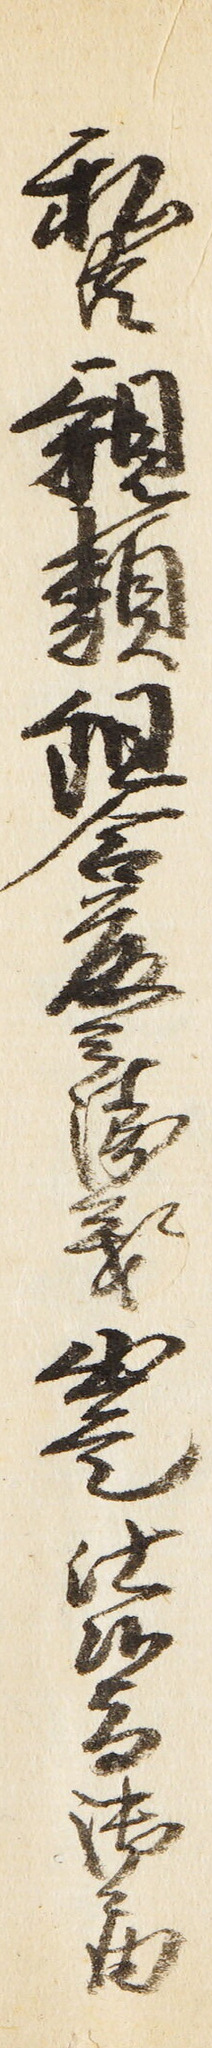一私共親類組合藤兵衛義出走仕候旨御届
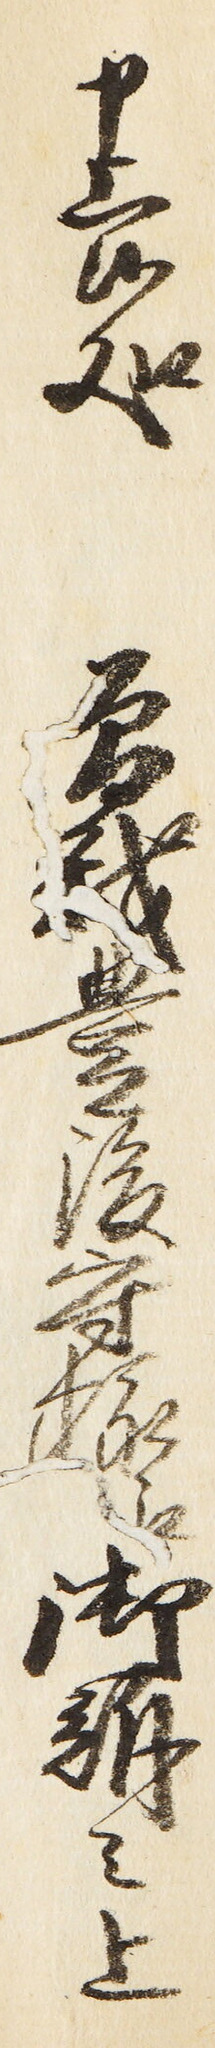申上候処曾我豊後守様江御訴之上
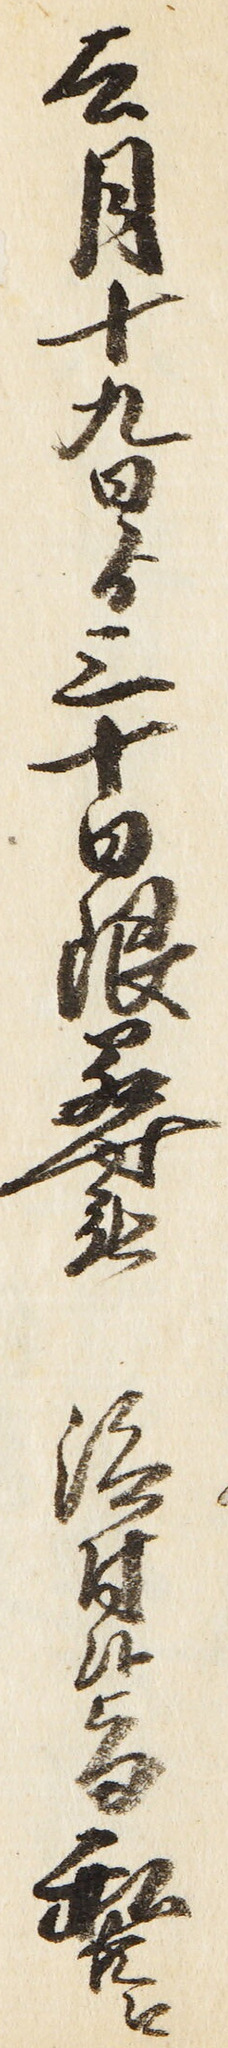去月十九日ゟ三十日限尋被仰付候旨私共江
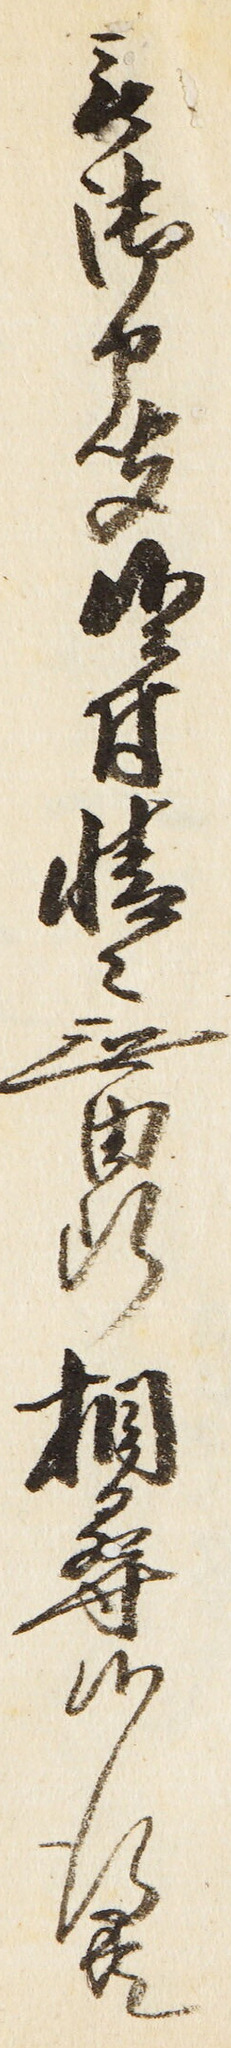被御申聞候ニ付情々無油断相尋候得共
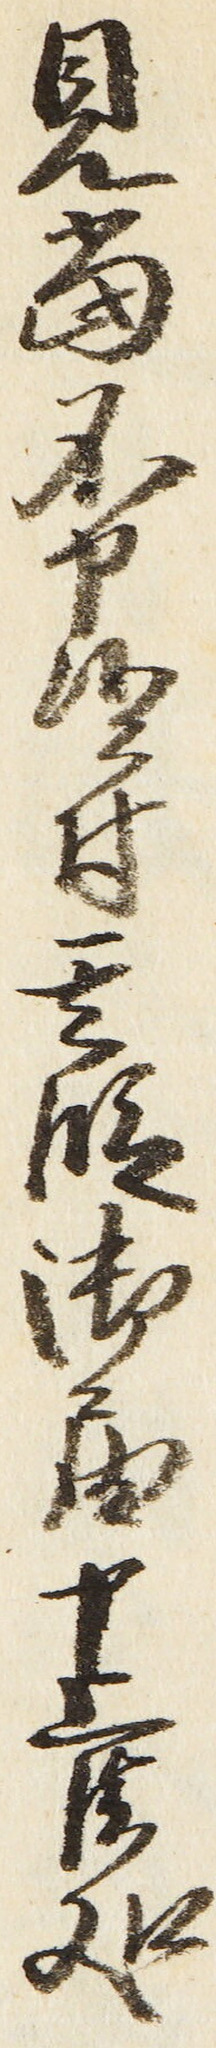見当不申候ニ付其段御届申上候処
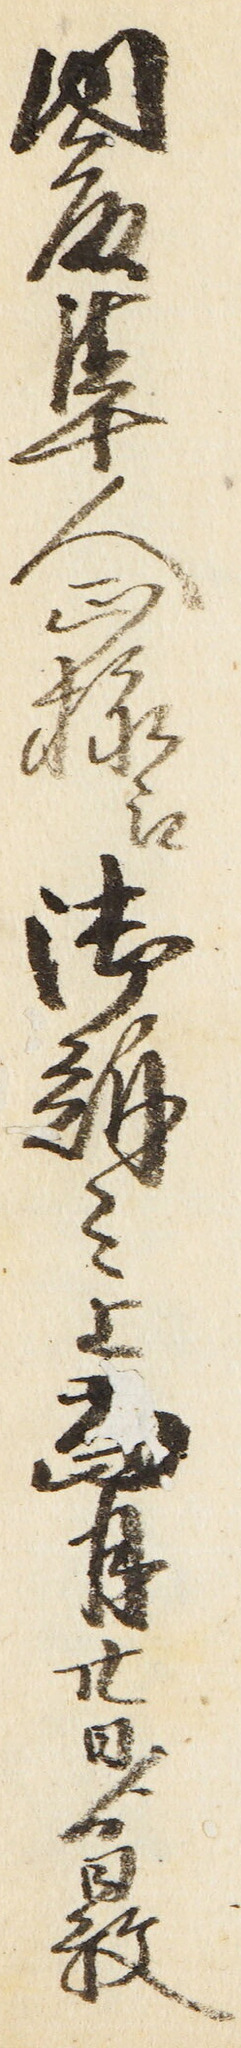内藤隼人正様江御訴之上当月廿日ゟ日数

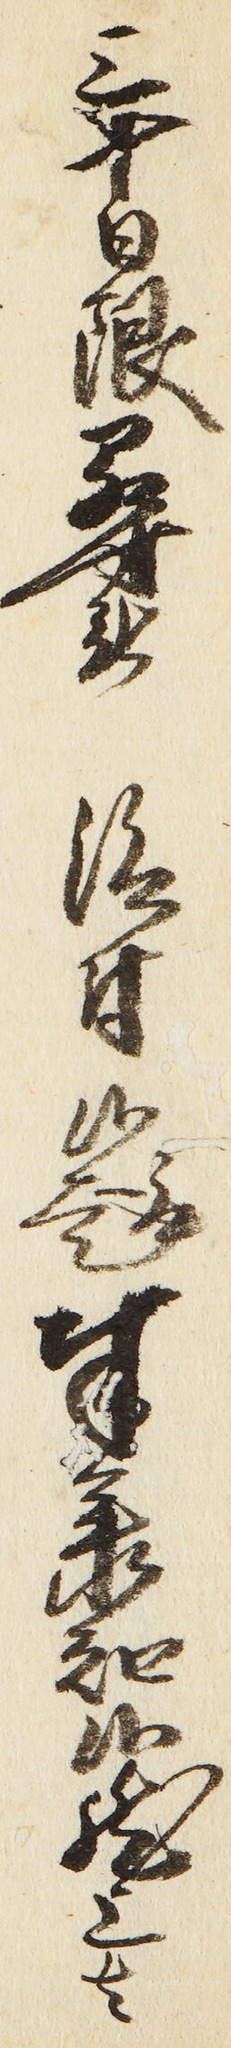三十日限尋被仰付候趣奉承知候然上者
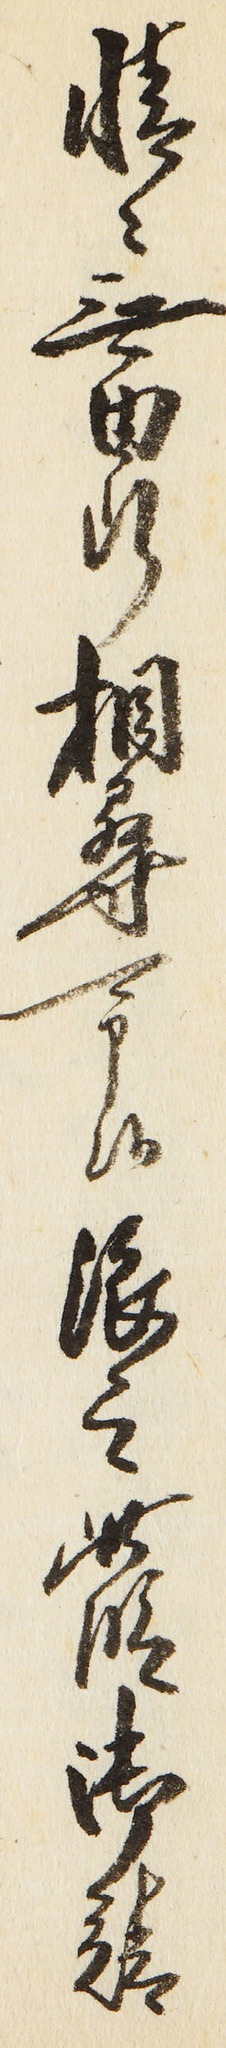情々無油断相尋可申候依之此段御請
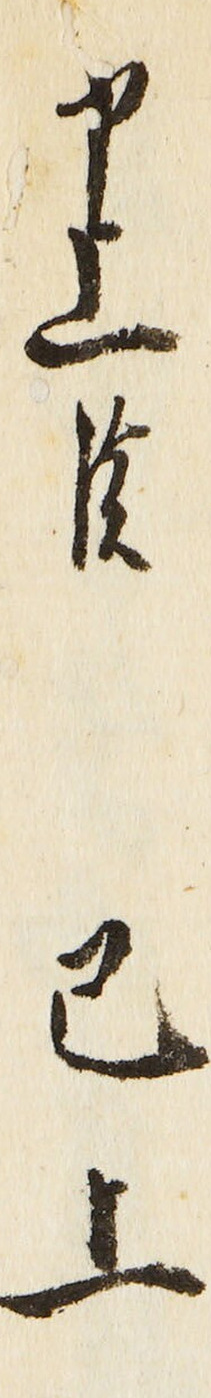申上候已上
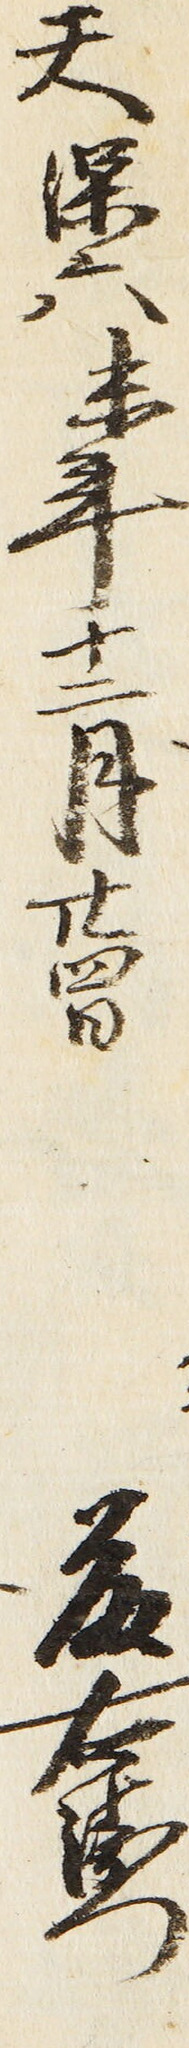天保六未年十二月廿四日親類惣代
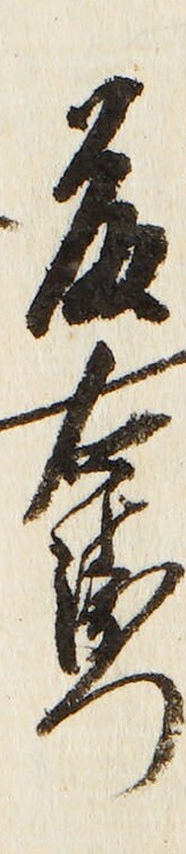藤右衛門
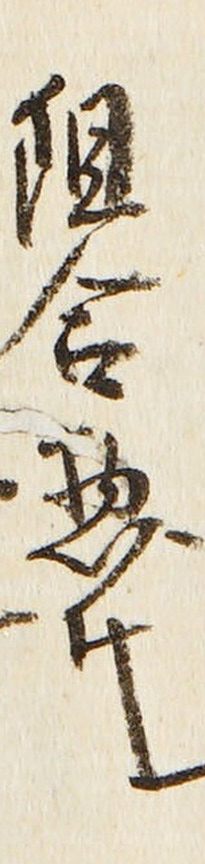組合惣代
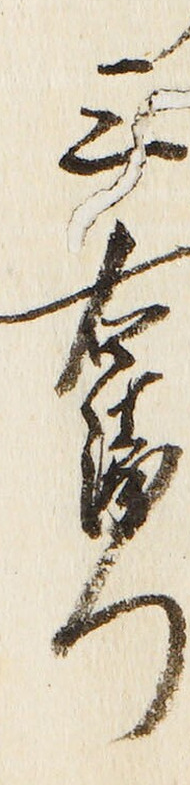三右衛門
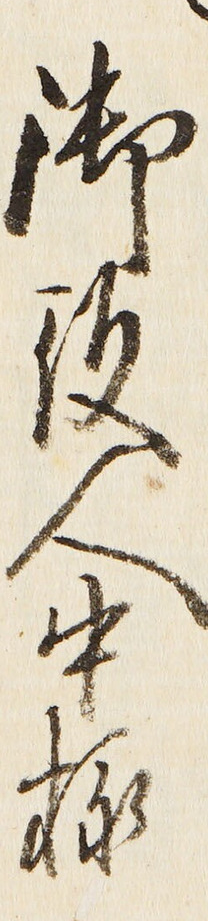御役人中様
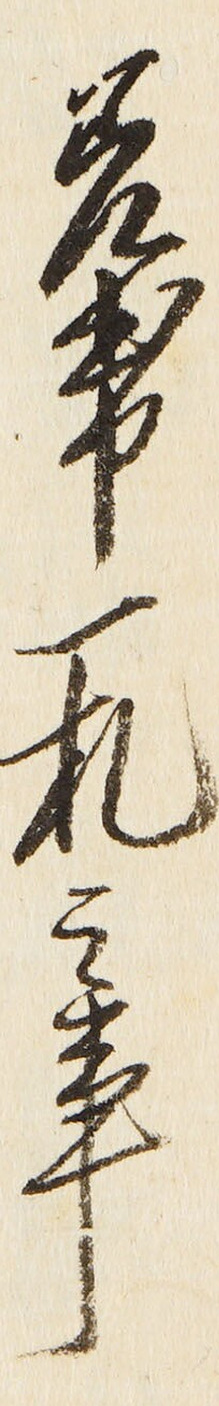差出申一札之事
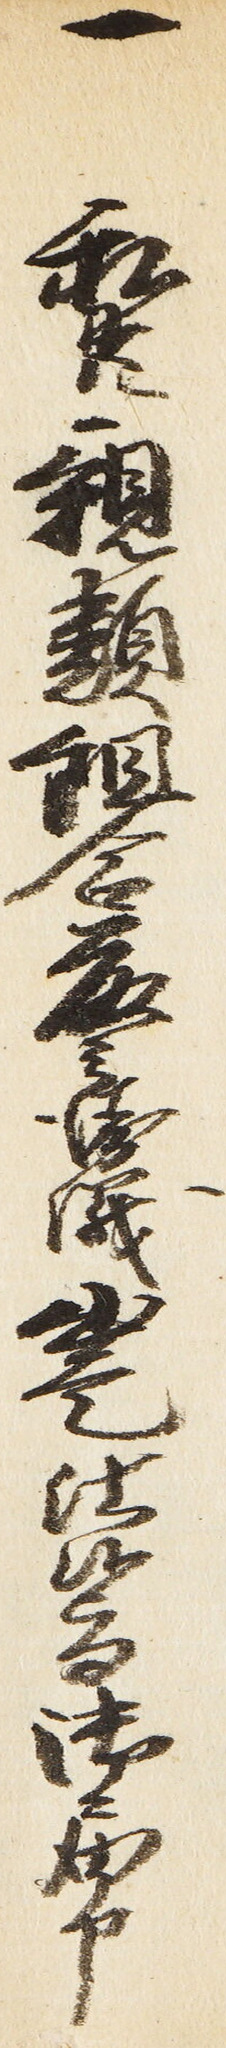一私共親類組合藤兵衛義出走仕候旨御届申
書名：難船一件記録
